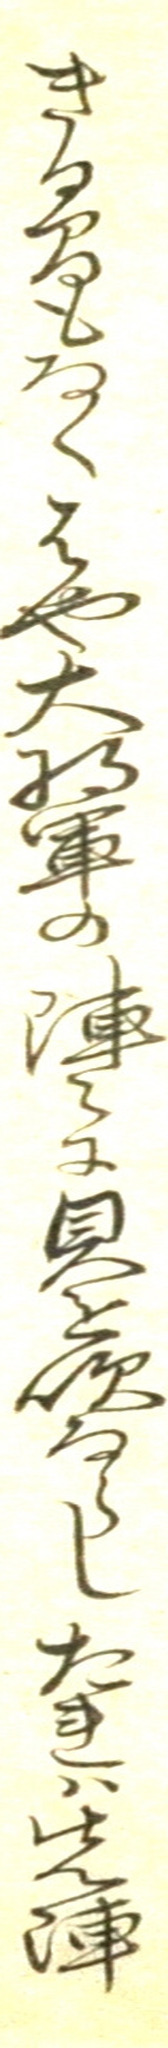きる間もなくはや大将軍の陣々に貝を吹ならしたれは先陣
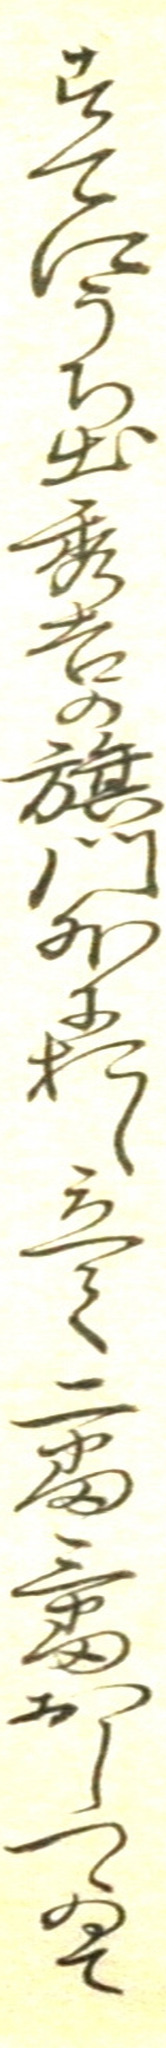すてにうち出秀吉の旗門外におし立て二番三番おしつゝゐて
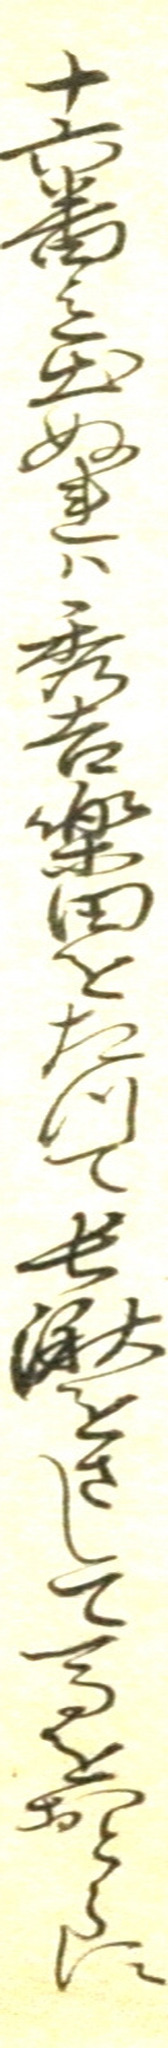十六番迄出ぬれは秀吉楽田をたつて長湫をさして馬をおとらす
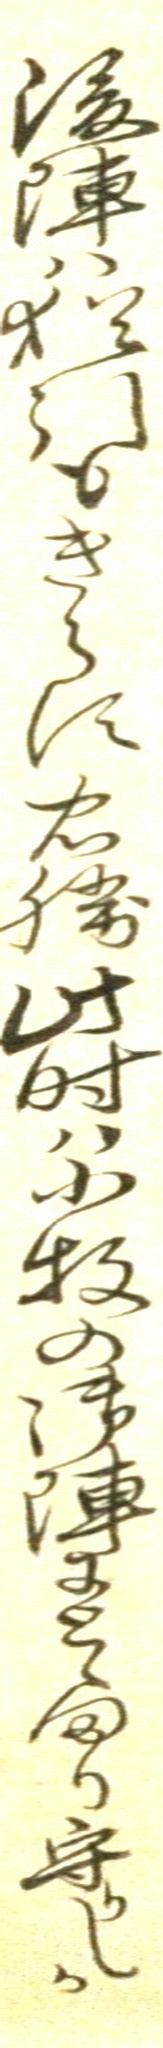後陣は猶引もきらす忠勝此時は小牧の御陣にとゝまり守りしか
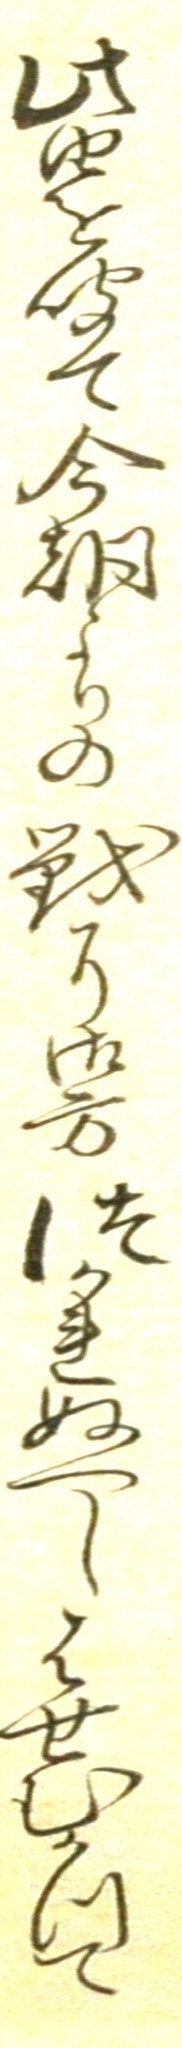此由を聞て今朝よりの戦に御方つかれぬへしはせむかつて
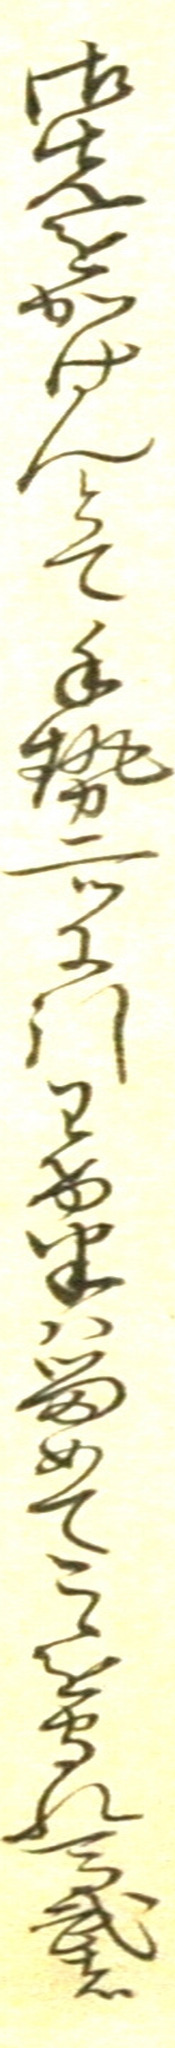御先をかけんとて手勢二ツに引わけ半は留めてこゝを守れ馬武者
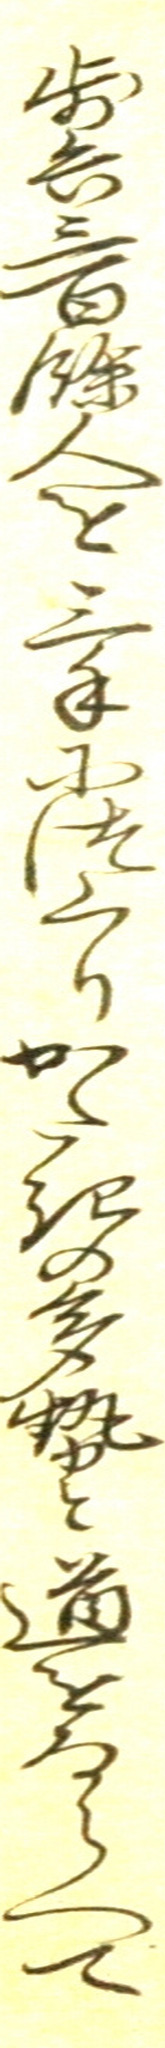歩兵三百余人を三手につくりかたきの多勢と道をならへて

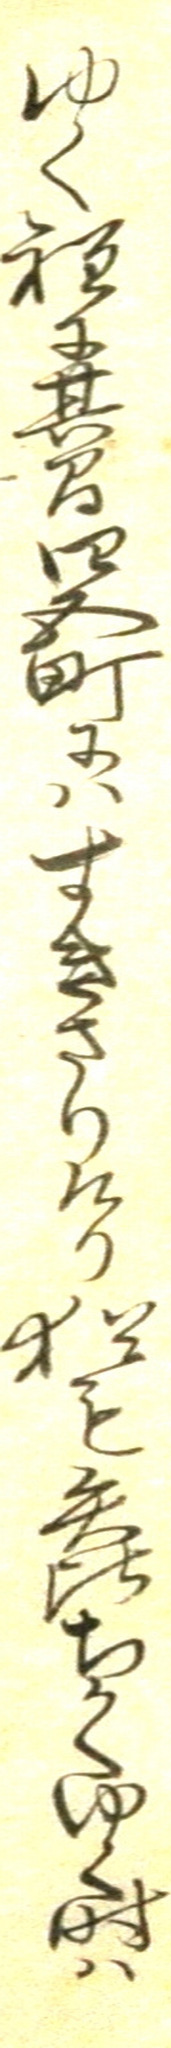ゆく程に其間四五町にはすきさりけり猶も矢比ちかくゆく時は
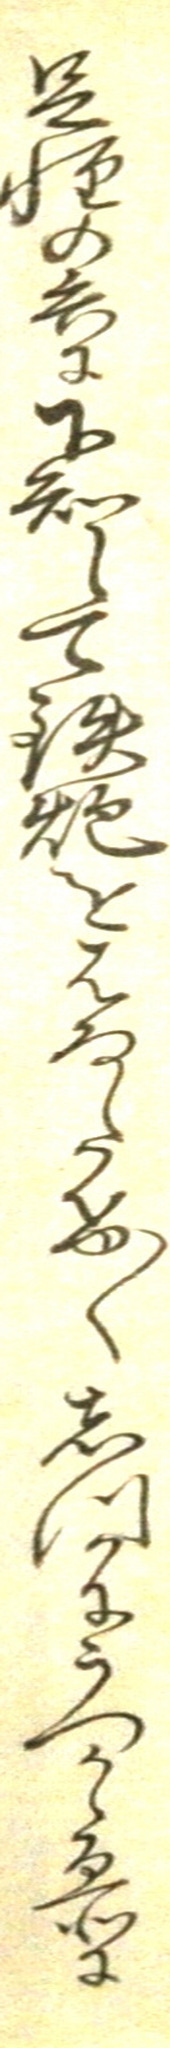足軽の兵に下知して鉄炮をはなしかけ〳〵しつかにうつかゝる所に
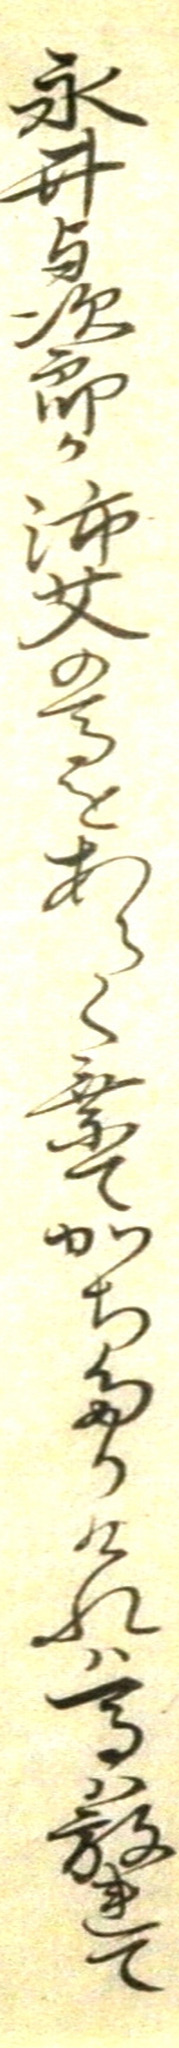永井与次郎か沛艾の馬をあらく乗てかちたりけれは馬は放れて
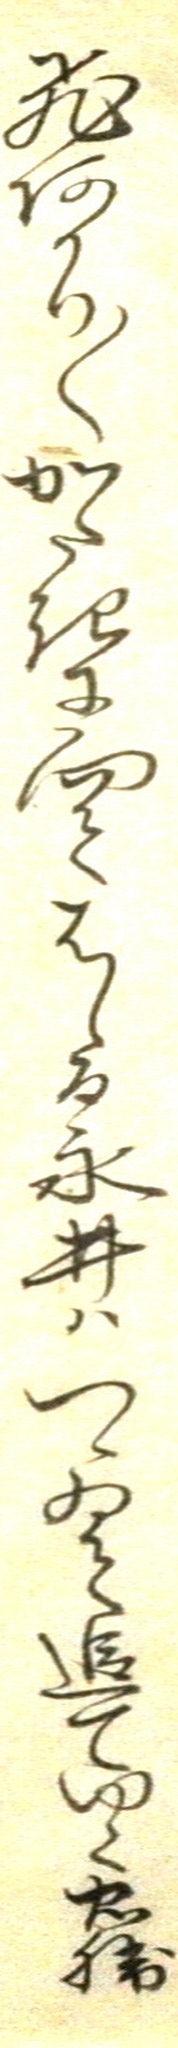飛あかり〳〵かたきに向てはしる永井はつゝゐて追てゆく忠勝
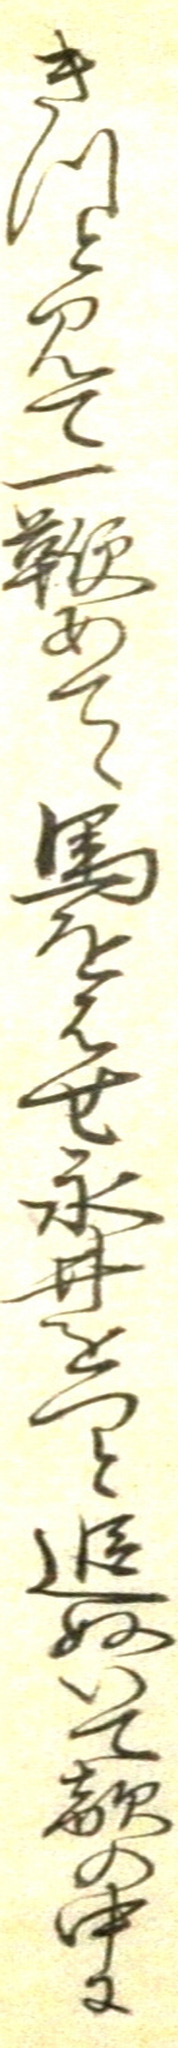きつと見て一鞭あてゝ馬をはせ永井をつと追ぬいて敵の中に
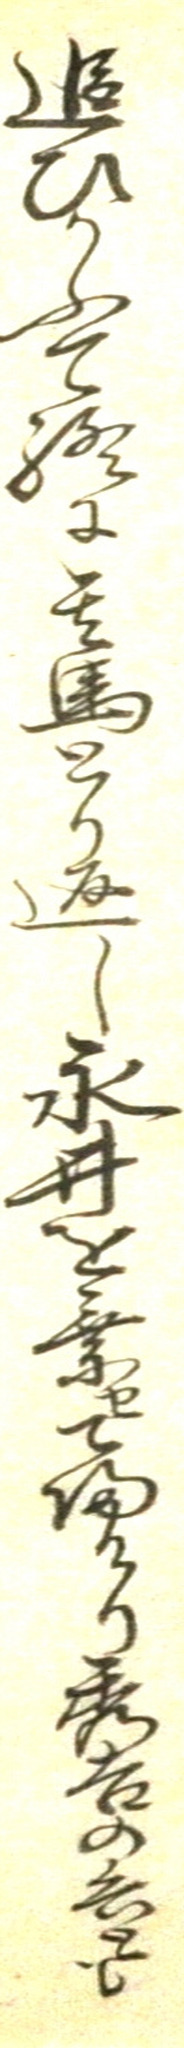追ひかふて終に其馬とり返し永井を乗せて帰けり秀吉の兵とも
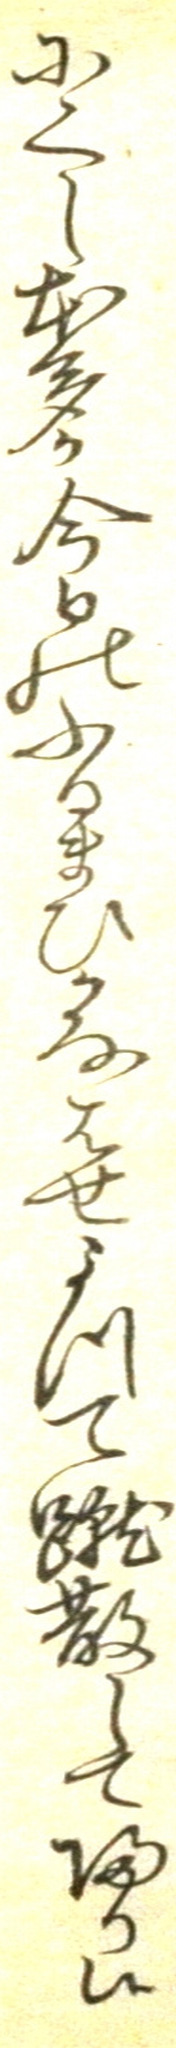にくし本多か今日のふるまひかなはせよつて蹴散して帰り候
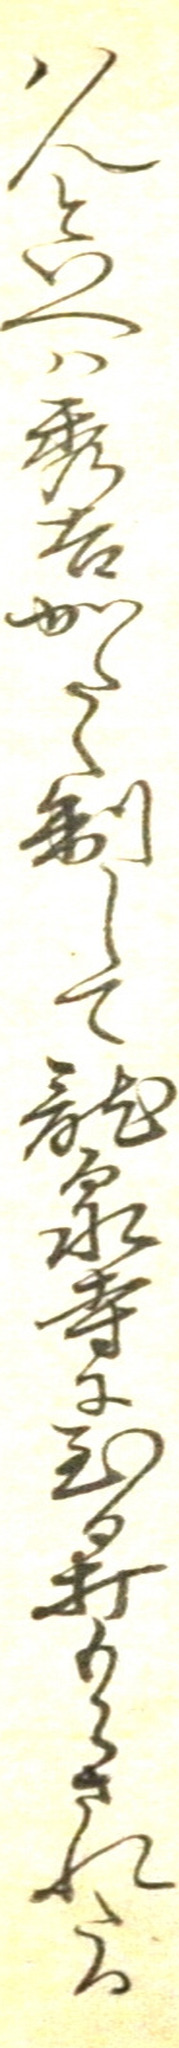はんといへは秀吉かたく制して龍泉寺に至る打もらされたる
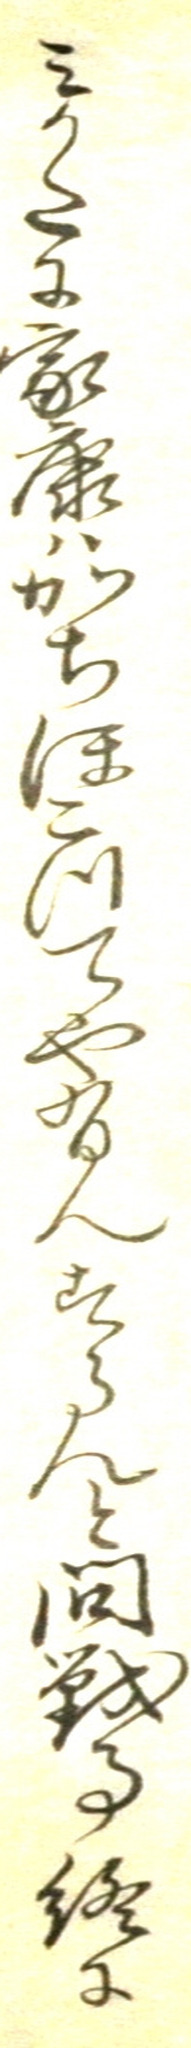みかたに家康はかちほこつてや有んすらんと問戦事終に
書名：藩翰譜（四・上）
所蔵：伊那市立高遠町図書館・合同会社AMANE
